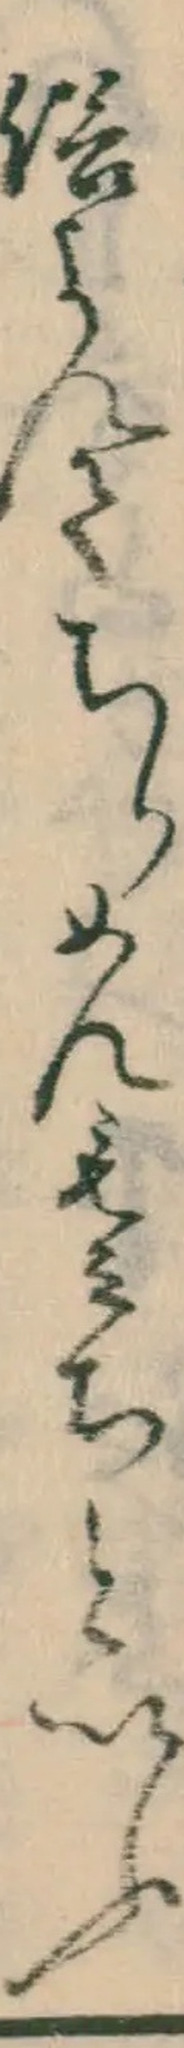俗よんてちりめんもみちといふ
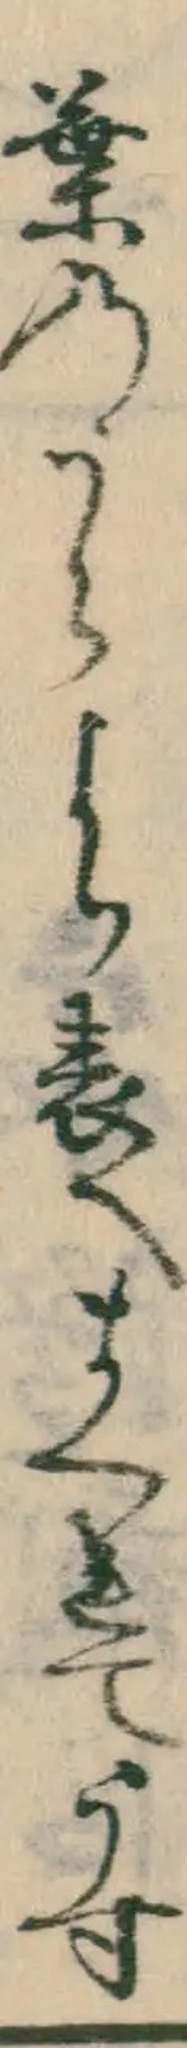葉のうらより表へまくれてうす
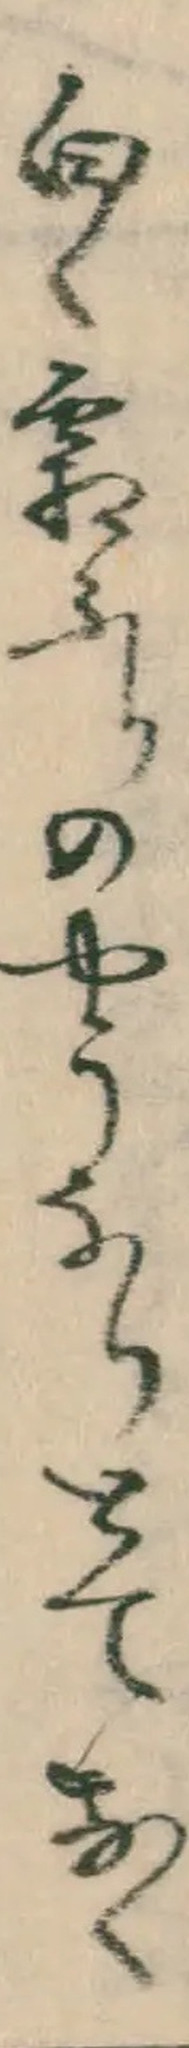白く霜ふりのやうなりとてをく
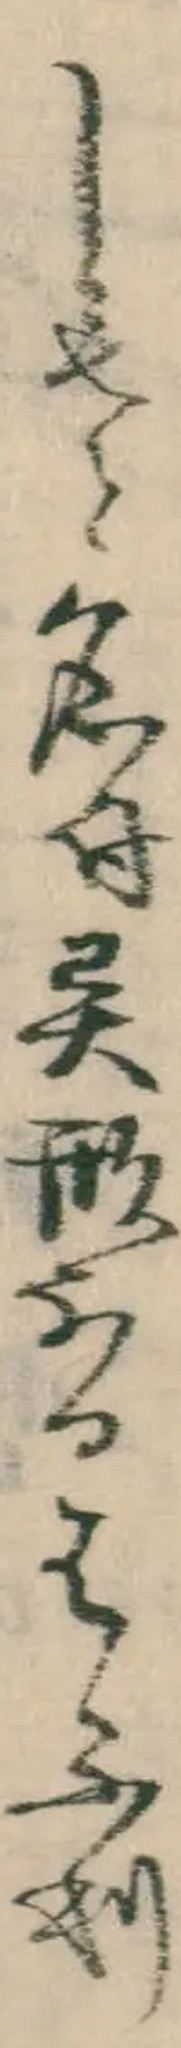しもと名付異形なるはふり
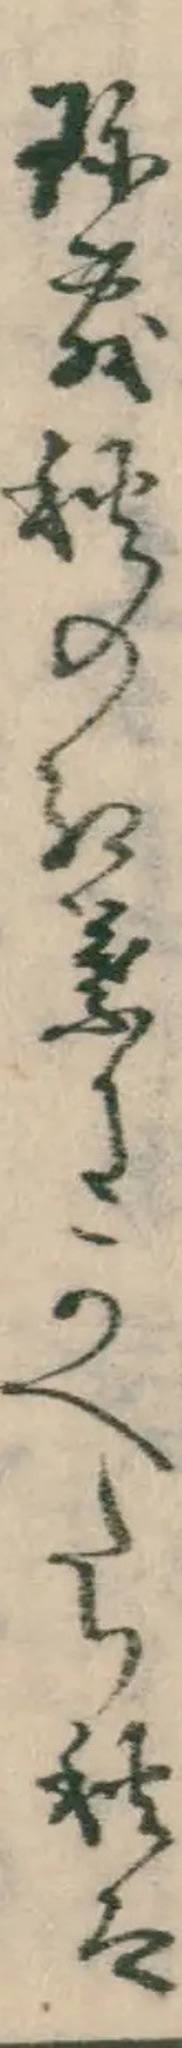珍敷秋の紅葉にかへたり秋は
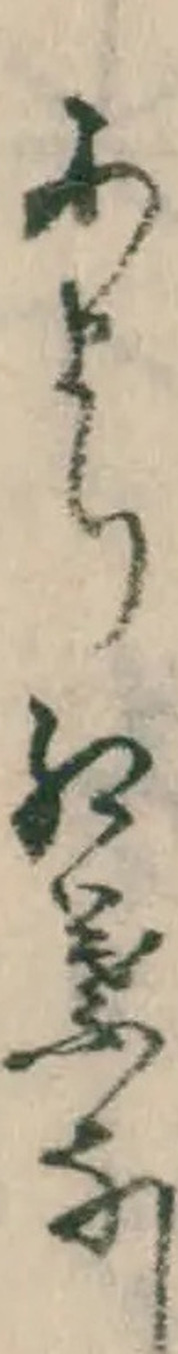あまり紅葉なし
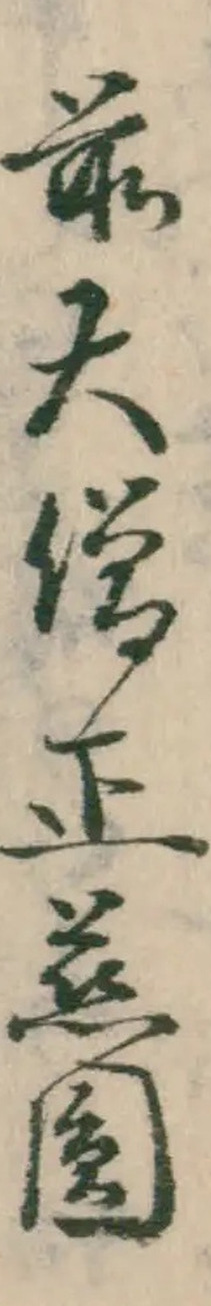前大僧正慈円
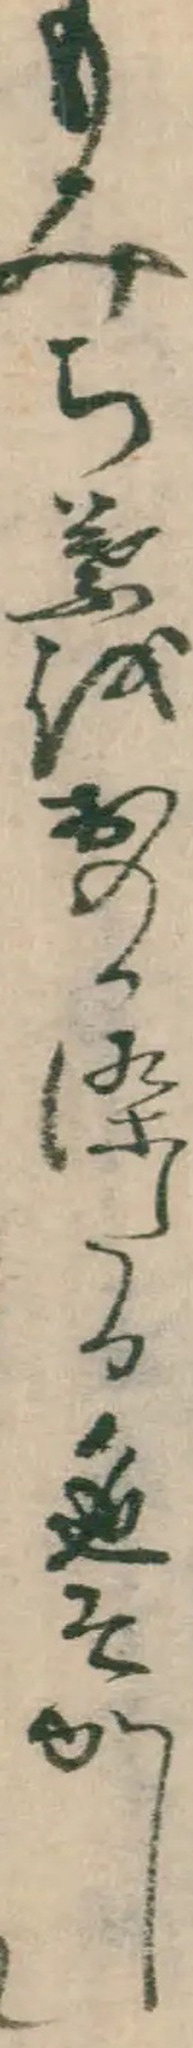もみち葉をおのか染たる色そかし
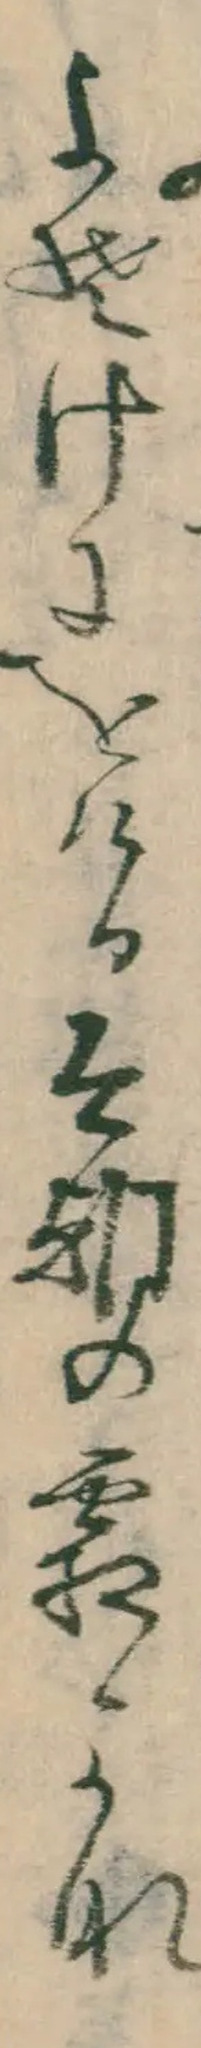よそけにをける今朝の霜かな

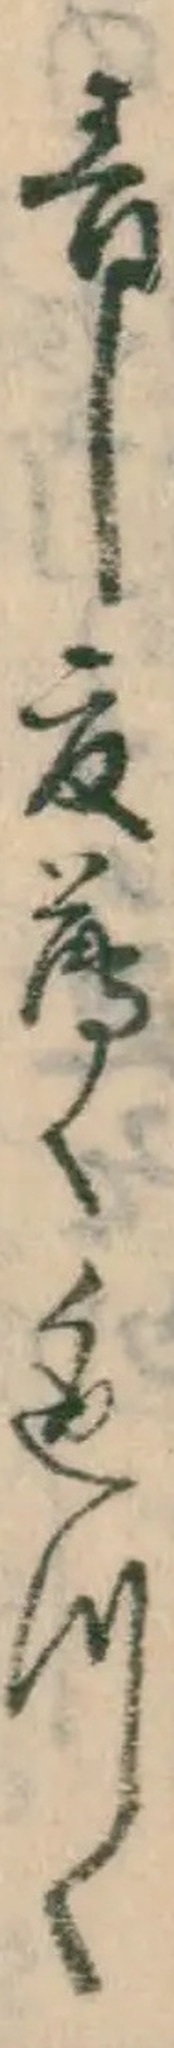青し夏薄く色つく
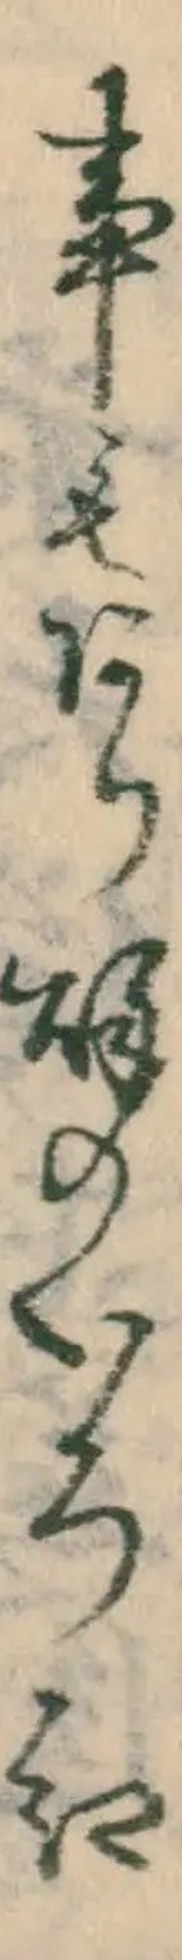事もあり秋のいろ紅
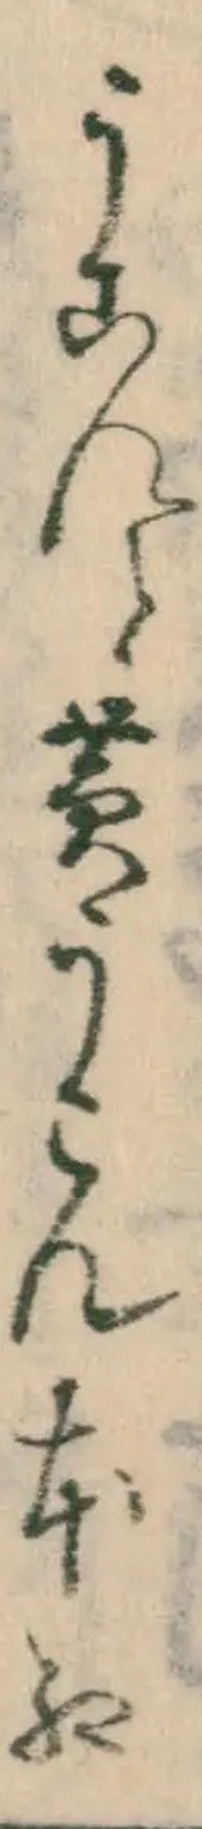うこんと黄うこん本紅
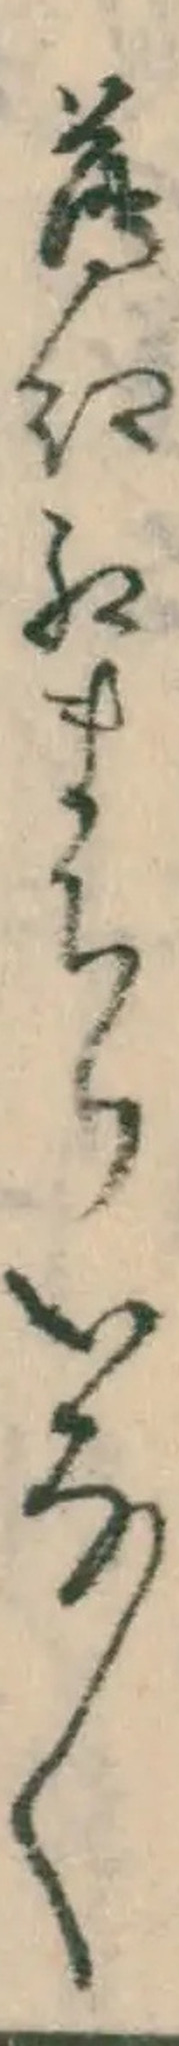薄き紅まちりいろ〳〵
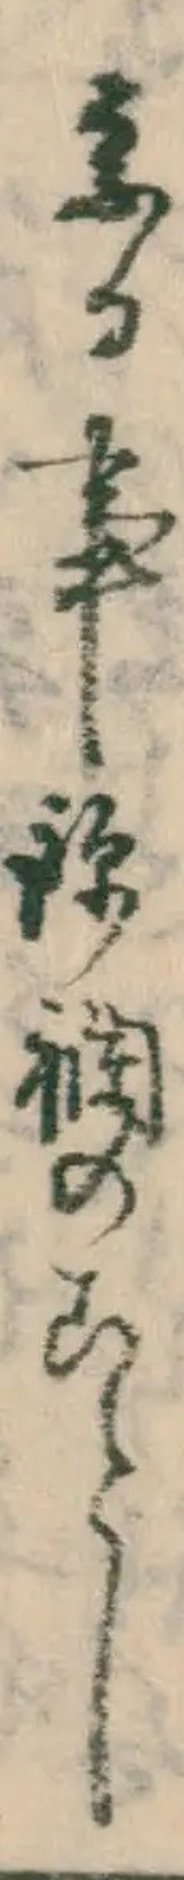なる事錦欄のことし
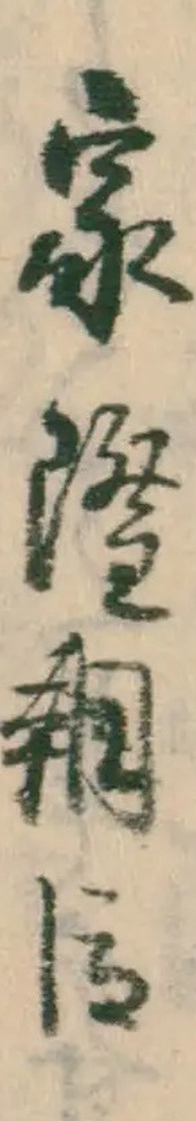家隆朝臣
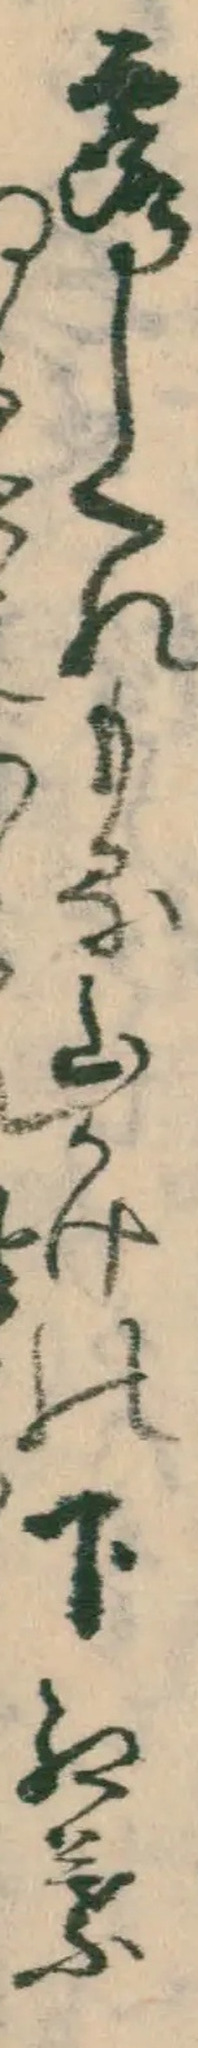露しくれもる山かけの下紅葉
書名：紅葉集
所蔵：国立国会図書館 National Diet Library, JAPAN
